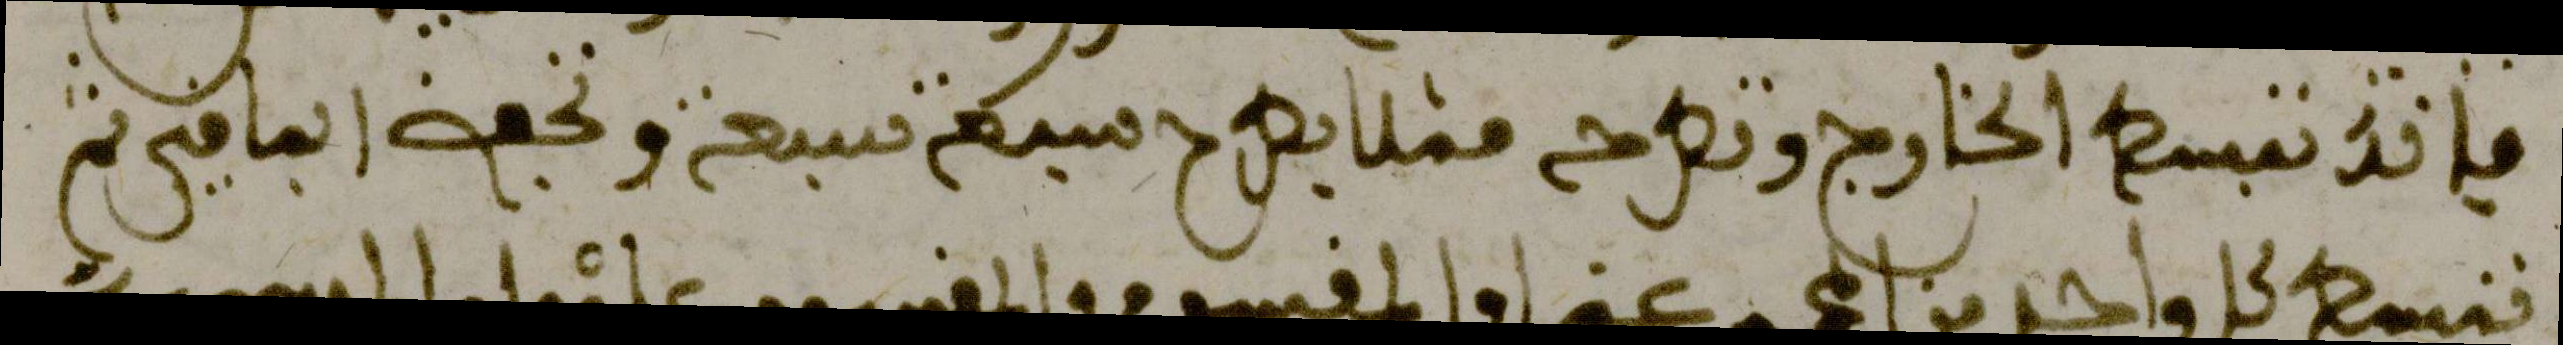فانك تبسط الخارج وتطرحه مثلا بطرح سبعة سبعة وتحفض الباقي ثم
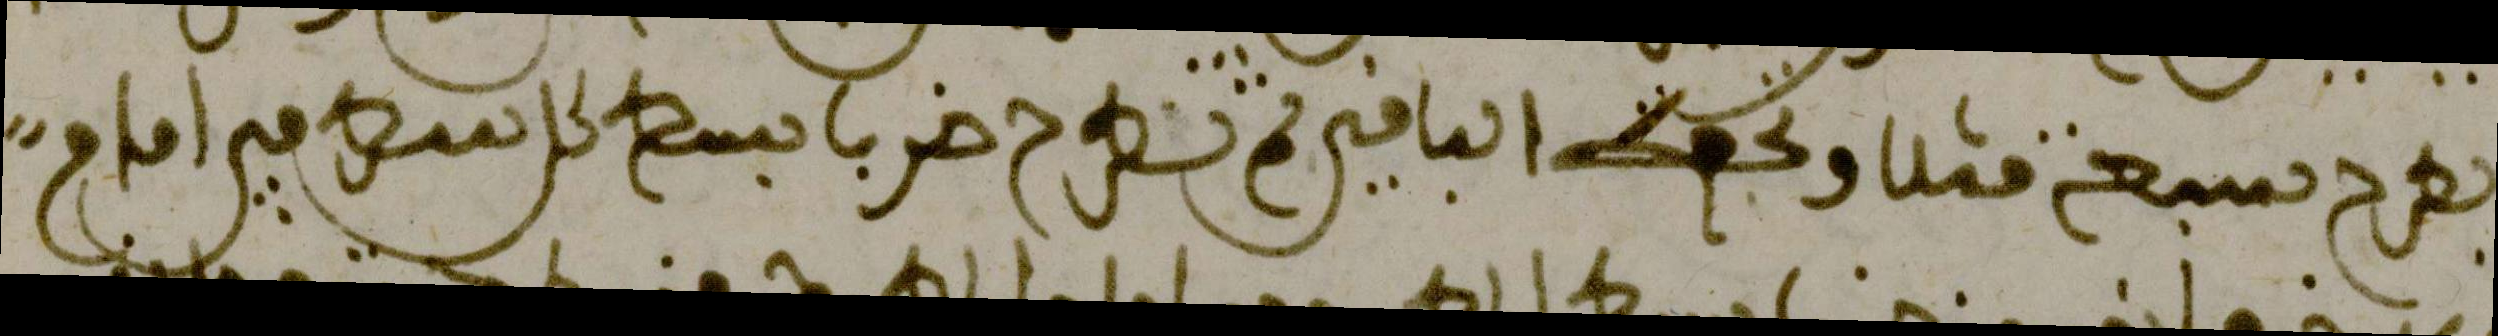بطرح سبعة مثلا وتحفظ الباقي ثم تطرح ضرب بسط كل سطر في امام
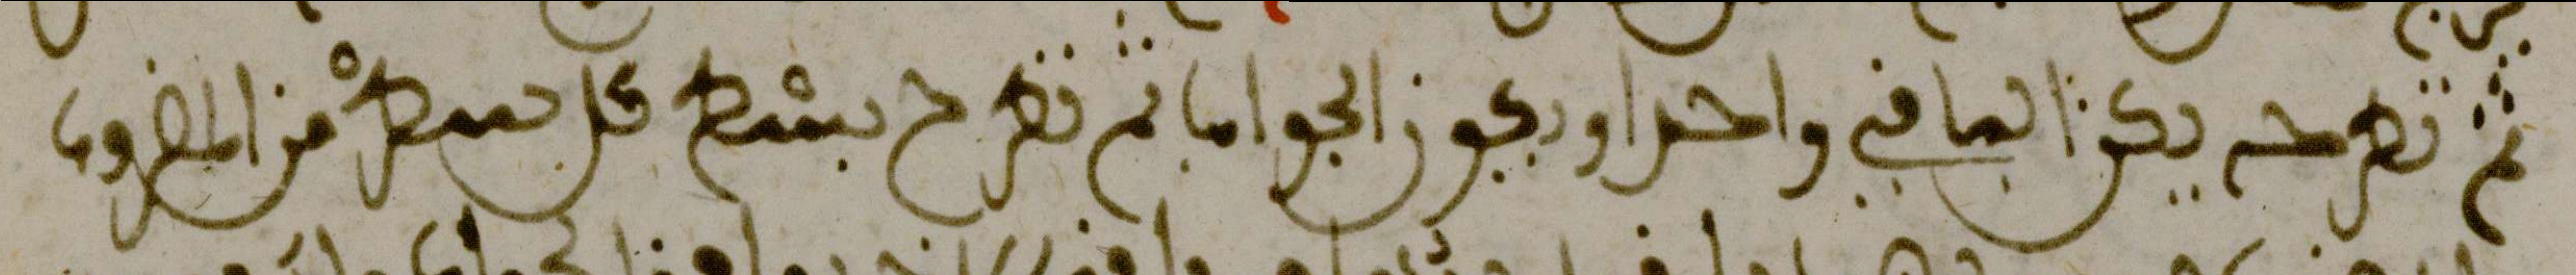ثم تطرحه يكن الباقي واحدا ويكون الجواب ثم تطرح بسْط كل سطْر من المضروب
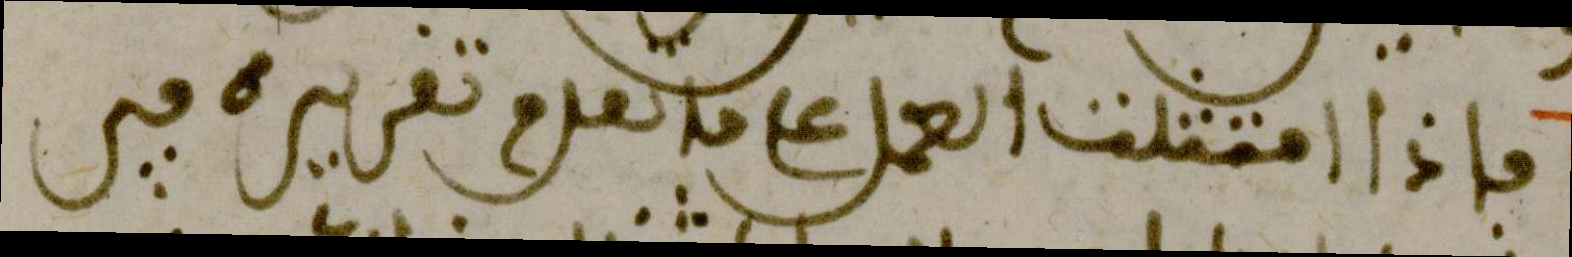فاذا امتثلت العمل على ما تقدم تقريره في
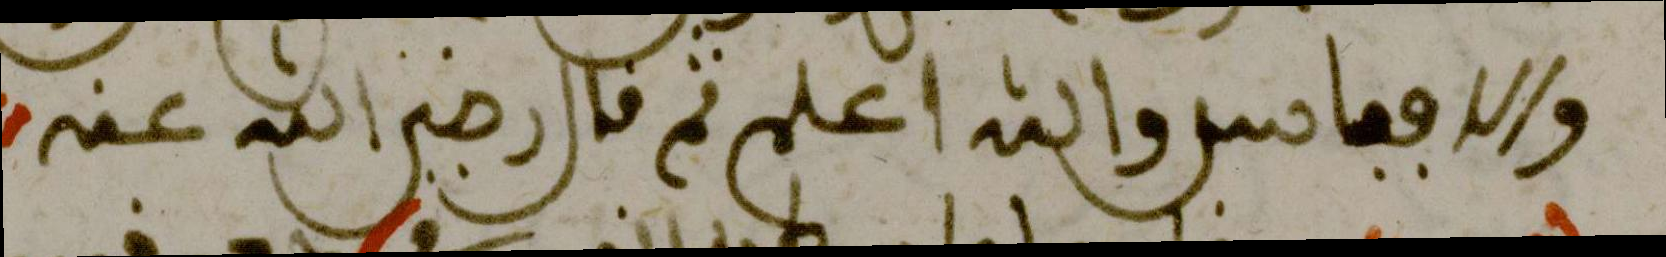والاففاسد والله اعلم ثم قال رضي الله عنه
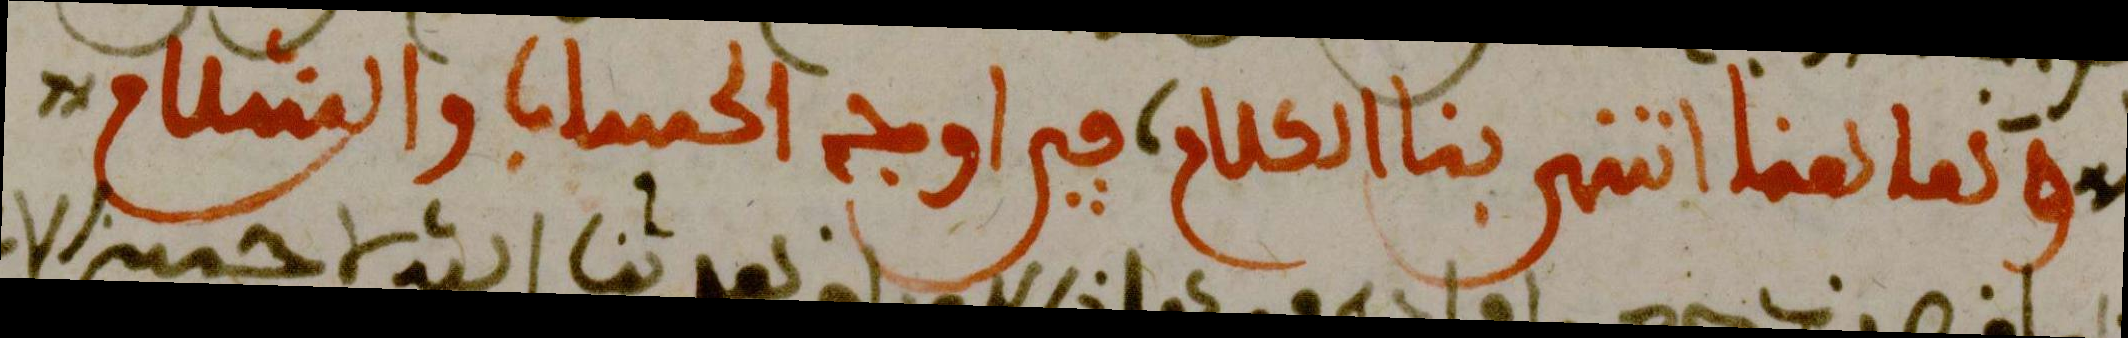وهاهنا انتهى بنا الكلام في اوجه الحساب والسّلام
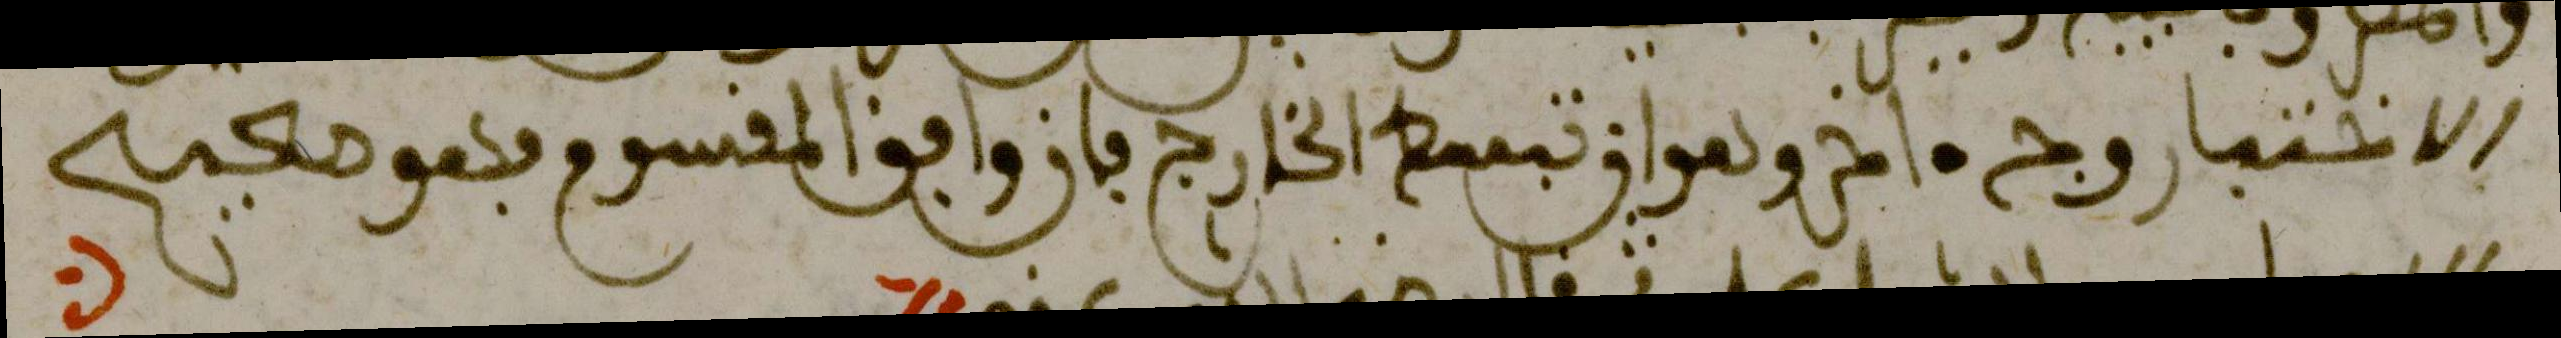الاختبار وجه ءاخر وهو ان تبسط الخارج فان وافق المقسوم فهو صحيح
